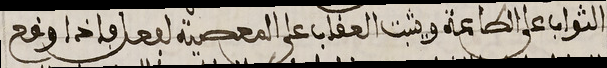الثواب على الطاعة ويثبت العقاب على المعصية لفعل فإذا وقع
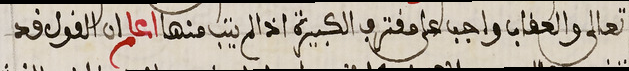تعالى و العقاب واجب على مقترف الكبيرة اذا لم يتب منها اعلم ان القول قد
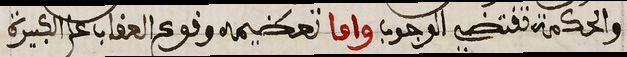والحكمة تقتضي الوجوب و اما تعظيمه وقوع العقاب على الكبيرة
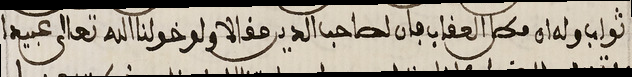ثواب و له ان مطل العقاب فان لصاحب الدين مقالا و لو خولنا الله تعالى عبيدا
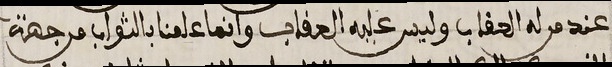عند من له العقاب وليس عليه العقاب وانما علمنا بالثواب من جهة
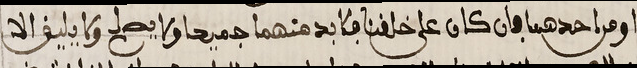او من احدهما فان كان على خلقنا فلا بد منهما جميعا و لا يصلح و لا يليق الا
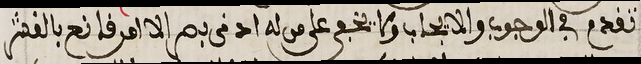تقدم فى الوجوب والإيجاب ولا يخفى على من له ادنى بصر الا امر
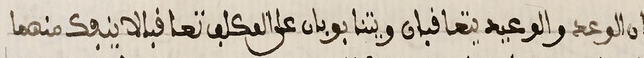ان الوعد والوعيد يتعاقبان ويتنابويان على المكلف تعاقبا لا ينفك منهما
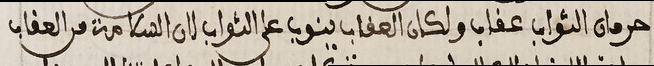حرمان الثواب عقاب و لكان العقاب ينوب على الثواب لان السلامة من العقاب
